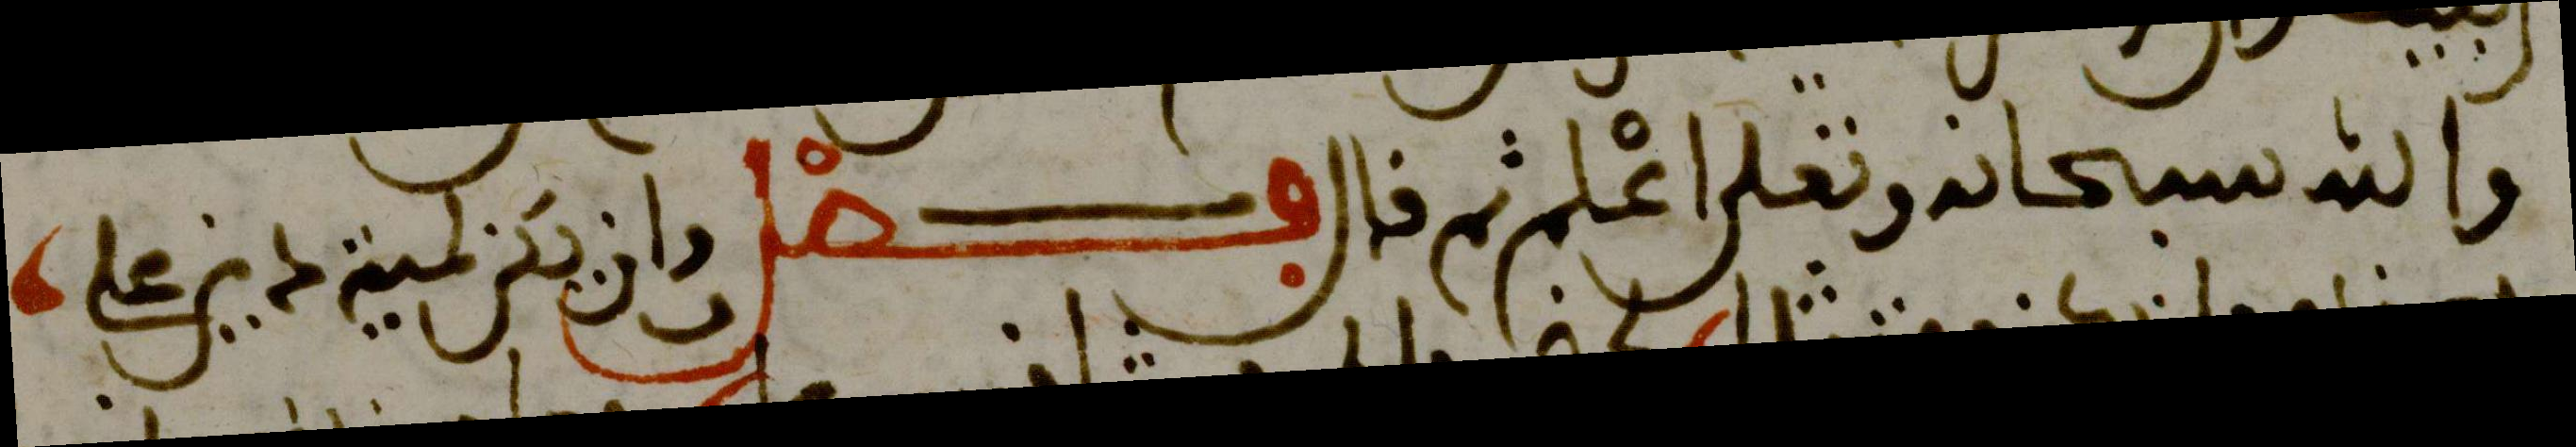والله سبحانه وتعلى اعْلم ثم قال فَصْل وان يكن المية دين على
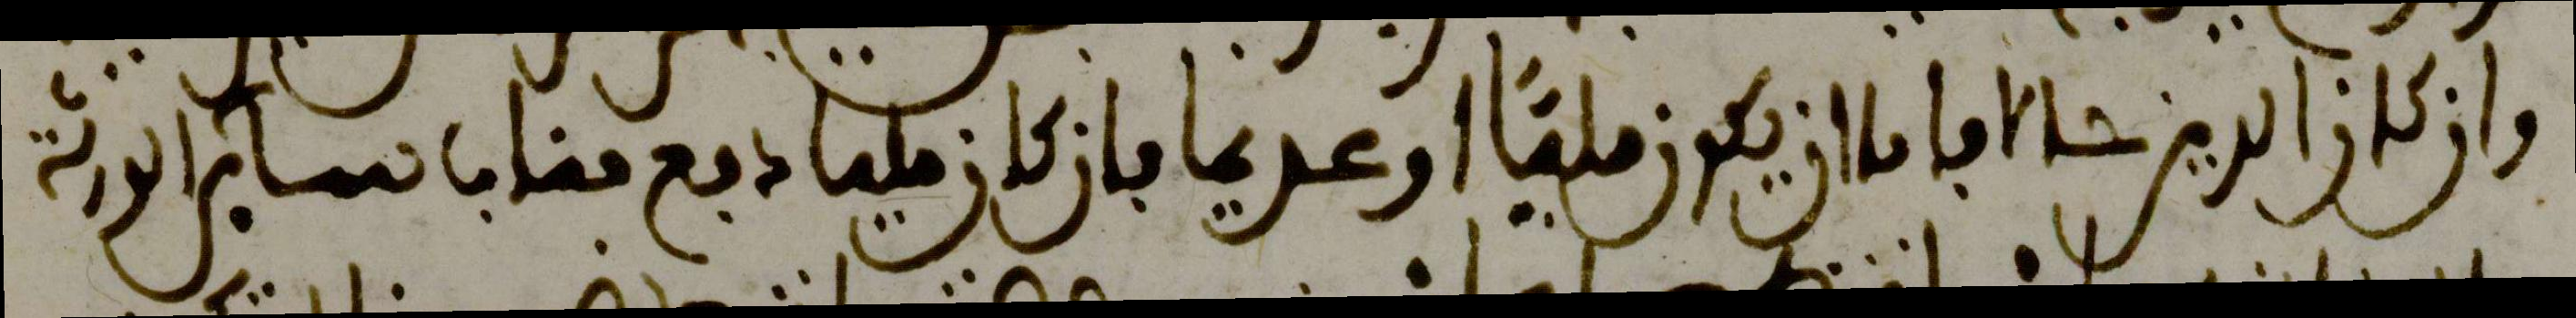وان كان الدين حالا فاما ان يكون مليًا اوو عديما فان كان مليا دفع مناب سائر الورثة
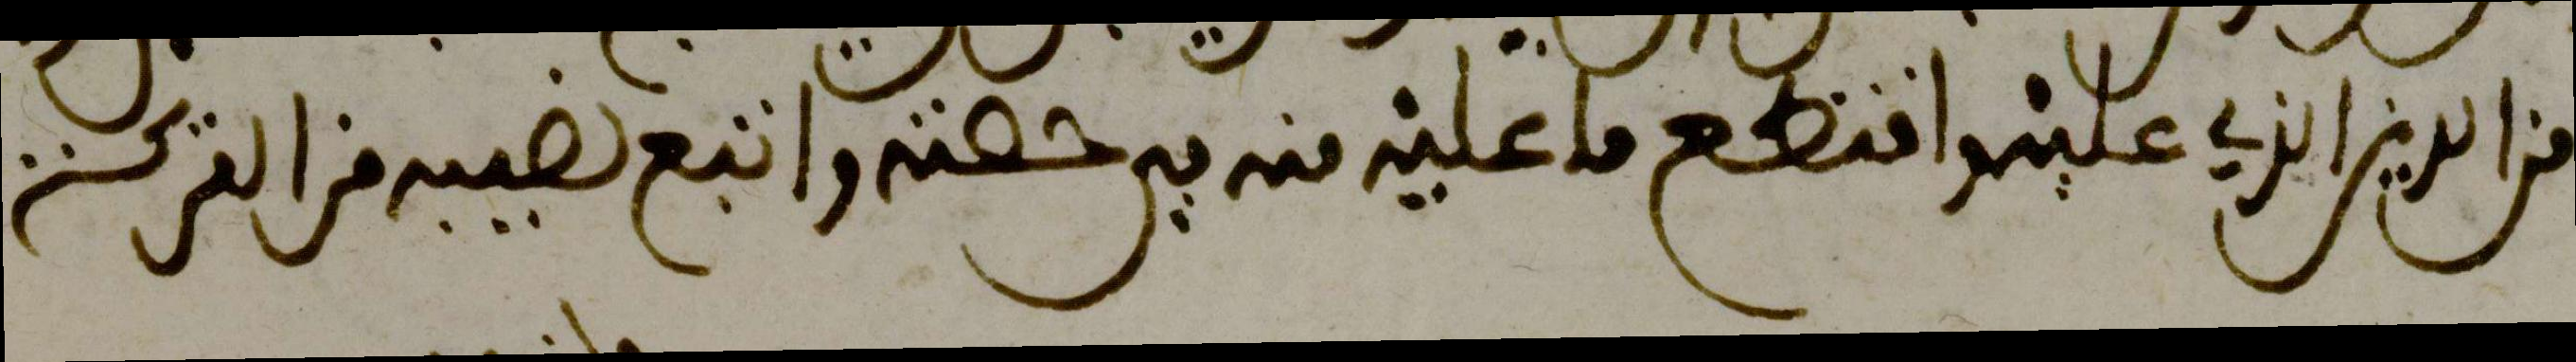من الدين الذي عليْه اقتطع ما عليْه منه في حصته واتبع نصيبه من التركة
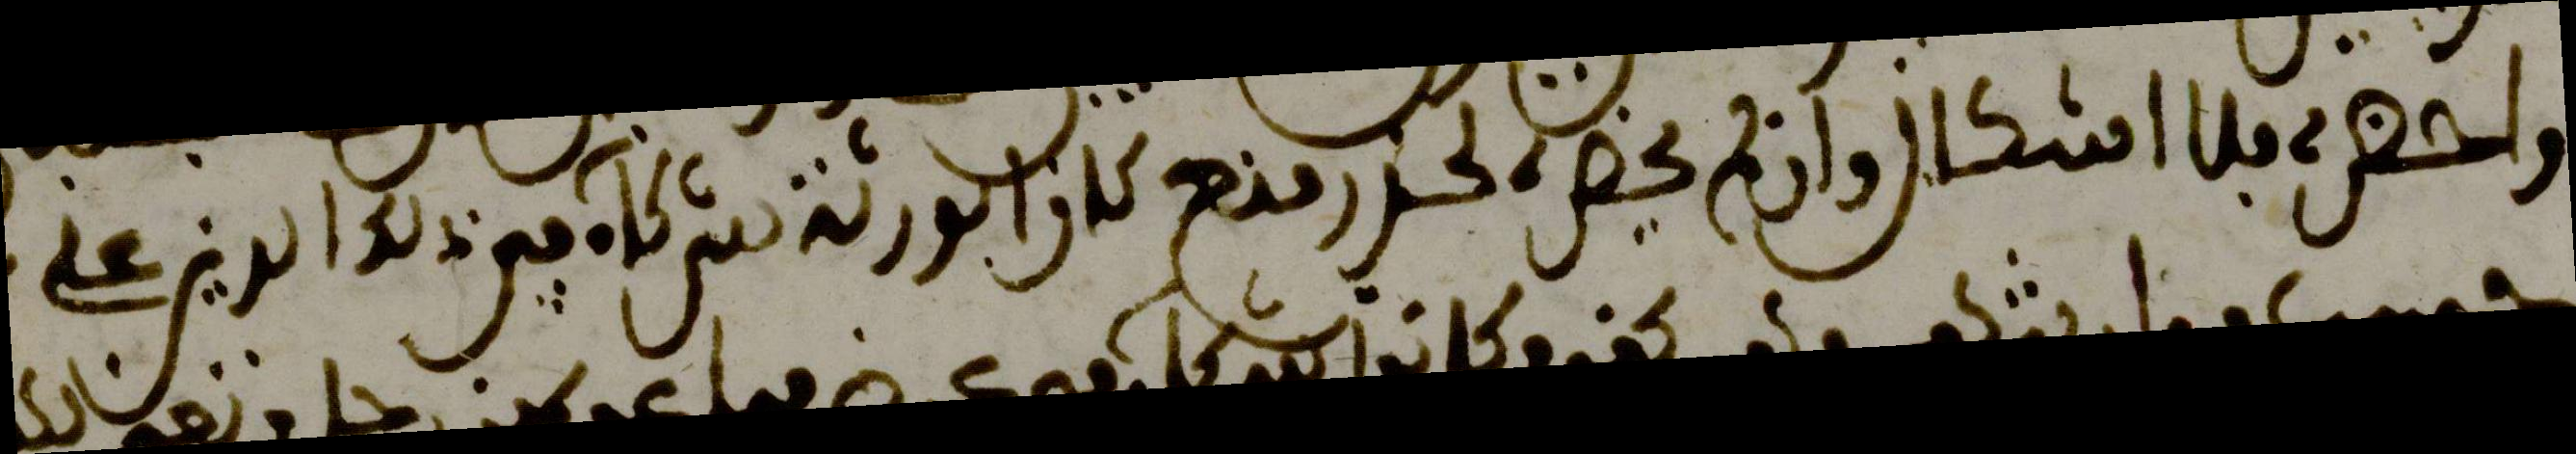واحضره فلا اشكال وان لم يحضره لحذر منع كان الورثة شركاء في ذلك الدين على
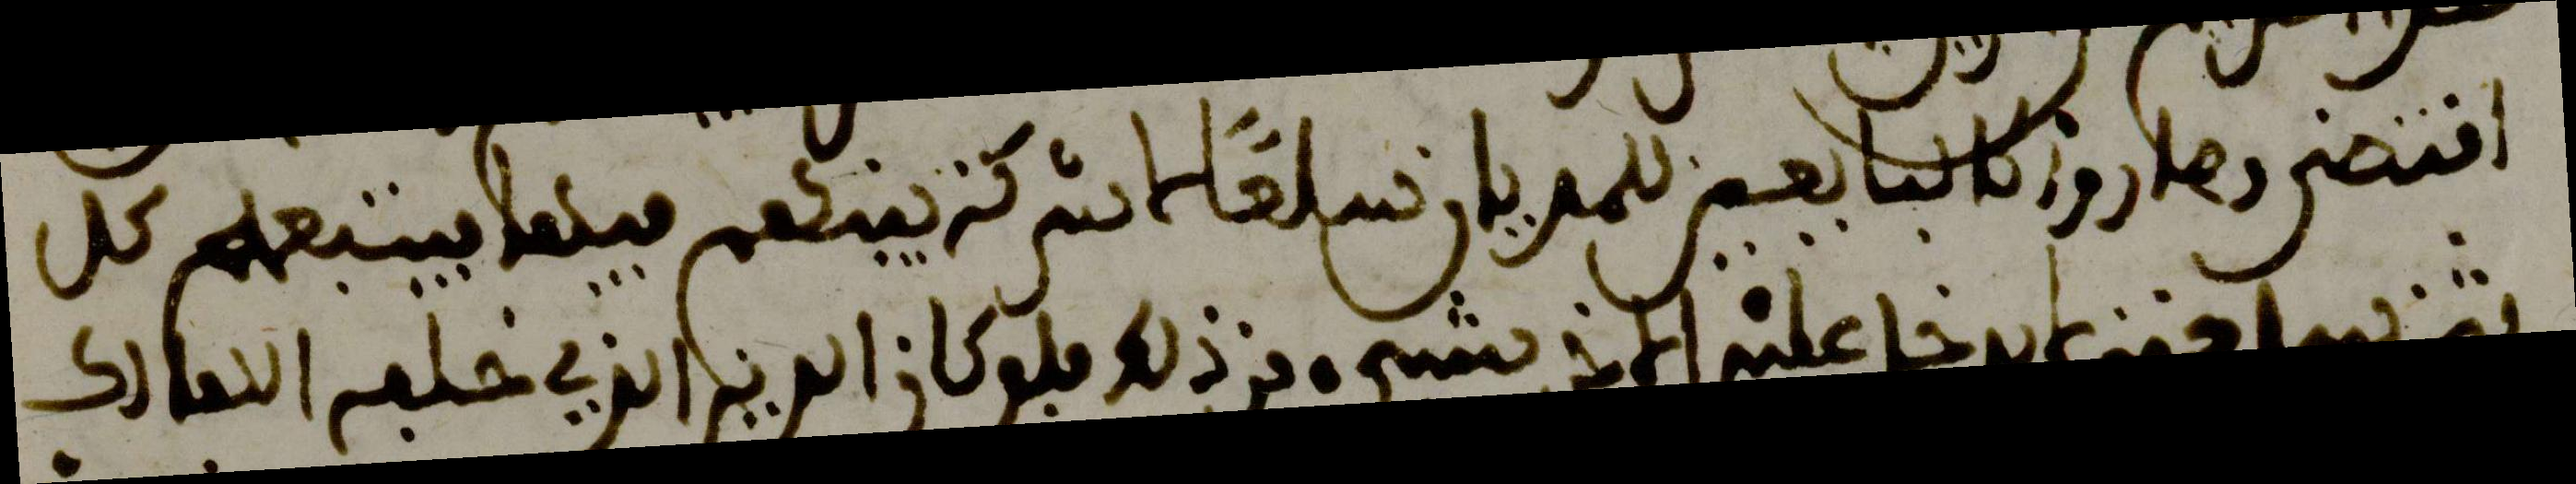اقتضى وصاروا كالبايعين للمديان سلعًا لا شركة بينهم فيها فيتبعهم كل
